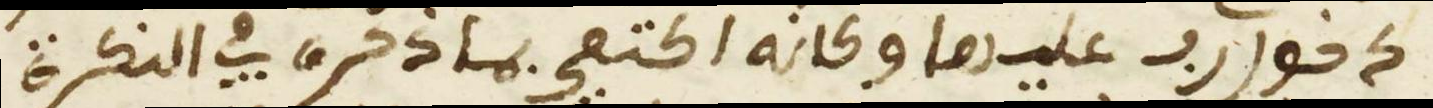دخول رب عليها وكانه اكتفي بما ذكره في النكرة
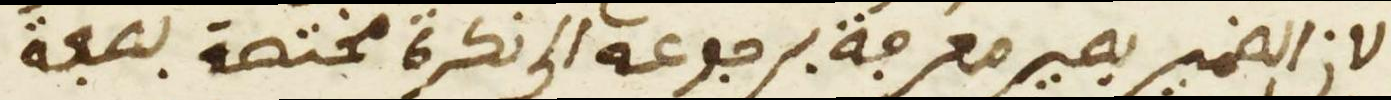لان الضمير يصير معرفة برجوعه الى نكرة مختصة بصفة
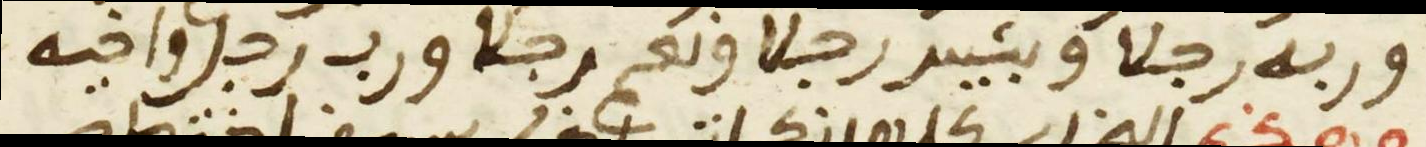وربه رجلا وبئيس رجلا ونعم رجلا ورب رجل واخيه
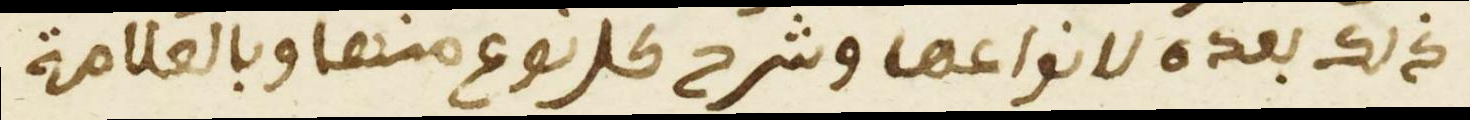ذلك بعده لانواعها وشرح كل نوع منها و بالعلامة المذكورة
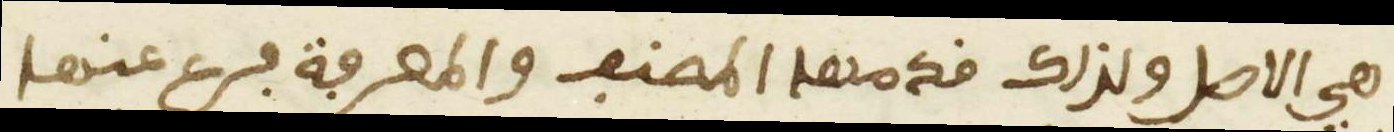هي الاصل وذلك قدمها المصنف والمعرفة فرع عنها
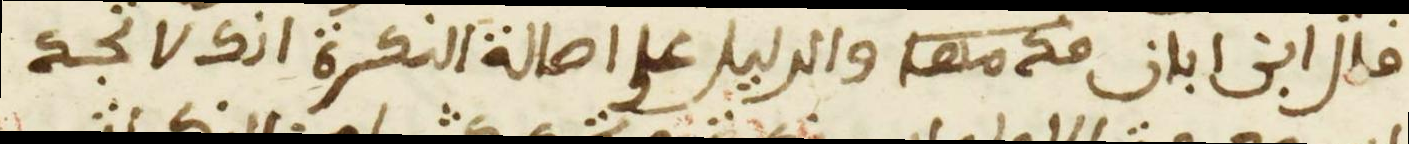قال ابن ابان قدمها والدليل على اصالة النكرة انك لا تجد
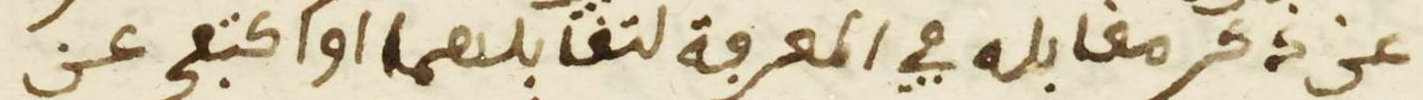عن ذكر مقابله في المعرفة لتقابلهما او اكتفى عن
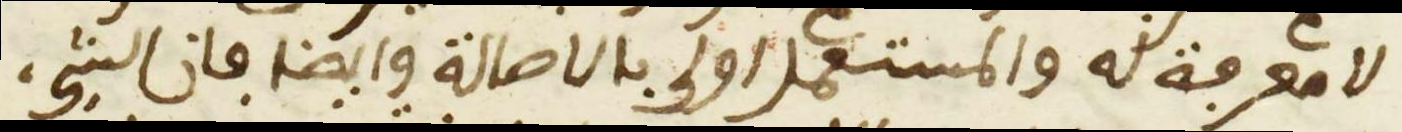لا معرفة له والمستعمل اولى بالاصالة وايضا فان الشيء
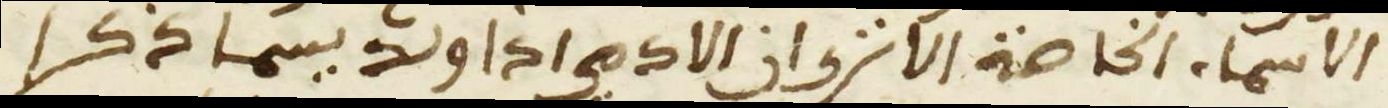الأسماء الخاصة الا ترو ان الادمي اذا ولد يسما ذكرا
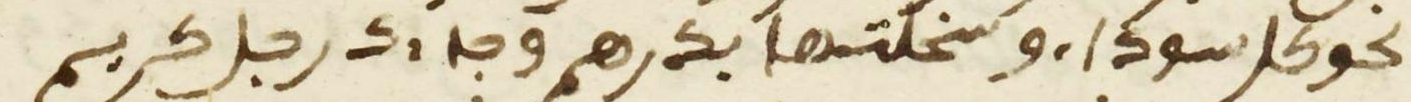نحو كل سوداء وسخلتها بدرهم وجاءك رجل كريم
